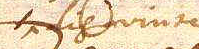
+, digo vinte
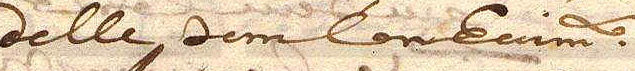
delle tem Conhecim.to
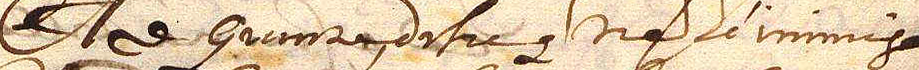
Ao quinto, disse q̄ naõ hé inimigo
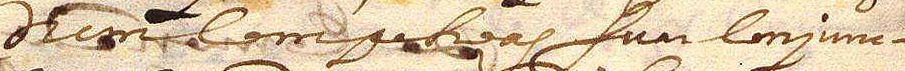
nem Com pessoas suas Conjuc
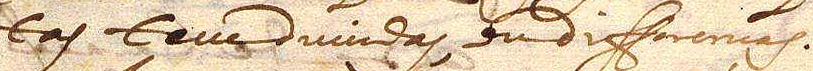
tas teue duuidas, ou differenças.
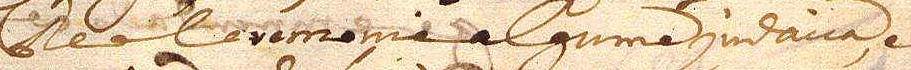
Reo Ceremonia alguma judaica, e
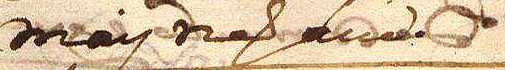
mais naõ dice.
